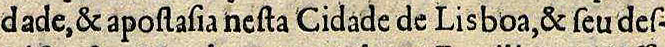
dade, & apostasia nesta Cidade de Lisboa, & seu des
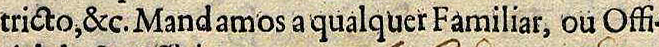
tricto, &c. Mandamos a qualquer Familiar, ou Offi
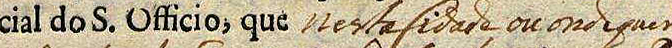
cial do S. Officio, que nesta Cidade, ou onde quer
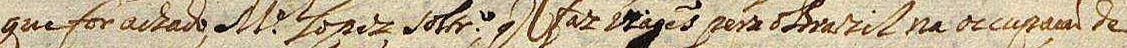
que for achado, M.el Lopez, soltr.o, q̄ faz viagēs pera o Brazil na occupaçaõ de
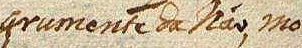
grumente da Náo, mo
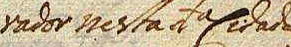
rador nesta d̄a Cidade
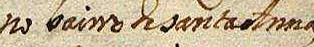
no bairro de santa Anna,
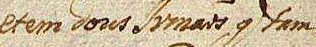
e tem dous Irmaõs, q̄ tam
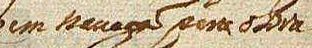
bem nauegaõ para o Bra
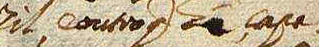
zil, e outro q̄ hé çapa
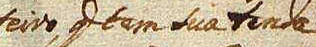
teiro, q̄ tem sua tenda
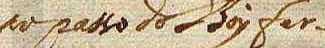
no passo do Boy fer
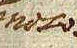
mozo.
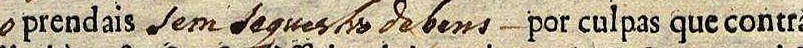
o prendais sem sequestro de bens por culpas que contra
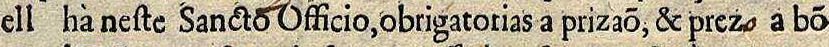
ell hà neste Sancto Officio, obrigatorias a prizaõ, & prezo a bō
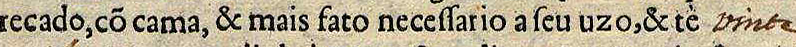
recado, cō cama, & mais fato necessario a seu uzo, & tè vinte
